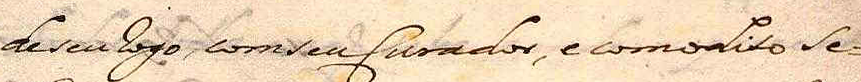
de seu Rogo, com seu Curador, e com o dito se
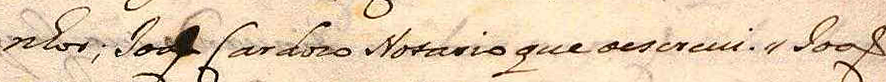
nhor; Joaõ Cardozo Notario que o escreui. // Ioaõ
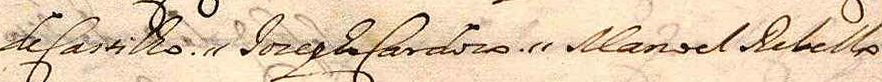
de Castilho. // Iozeph Cardozo. // Manoel Rebello
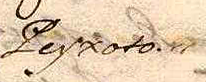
Peyxoto. //
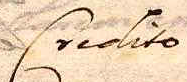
Credito.
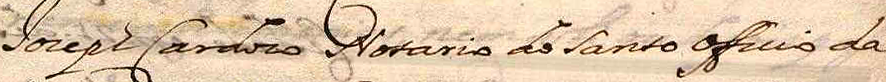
Iozeph Cardozo Notario do santo officio da
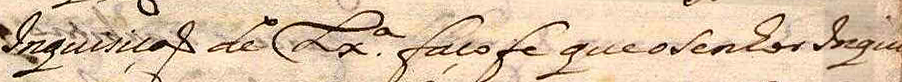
Inquisiçaõ de Lx.a faço fe que o senhor Inqui
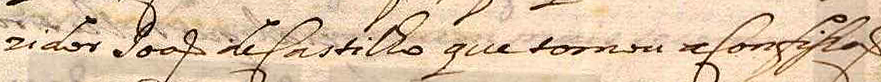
zidor Ioaõ de Castilho que tomou a Confissaõ
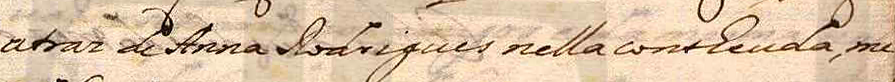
atraz de Anna Rodrigues nella contheuda, me
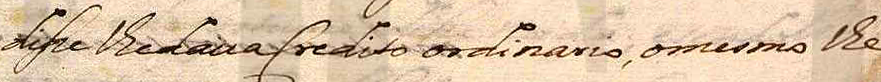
disse lhe daria Credito ordinario, o mesmo lhe
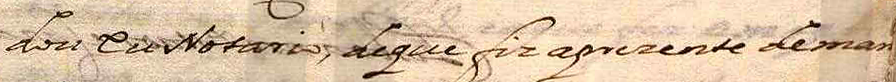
dou eu Notario, de que fiz a prezente de man
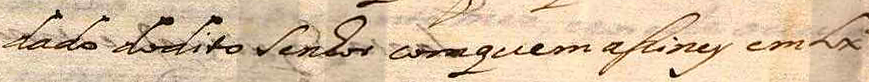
dado do dito Senhor com quem assiney em Lx.a
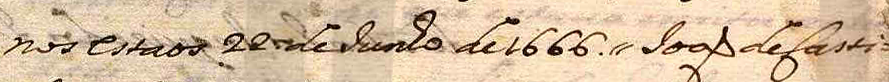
nos estaos 22 de Iunho de 1666. // Ioaõ de Casti
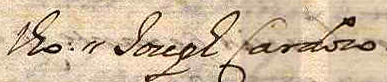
lho: // Iozeph Cardozo.
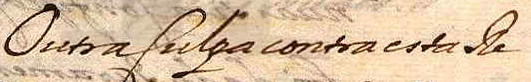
Outra Culpa contra esta Re
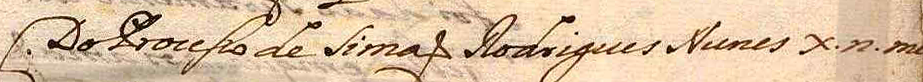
Do Processo de Simaõ Rodrigues Nunes x. n. me
